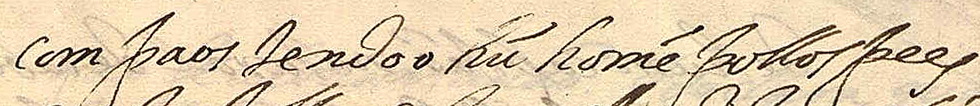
com paos tendoo hū homē pollos pees
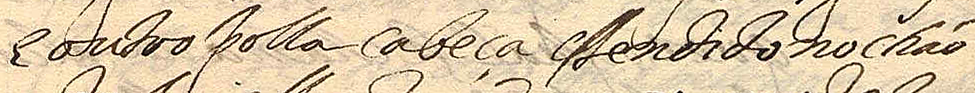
E outro polla cabeça estendido no chaõ
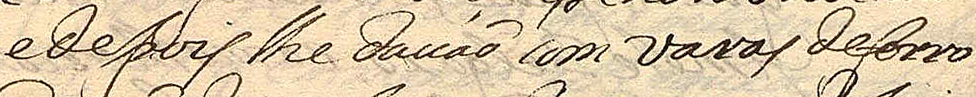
e depois lhe dauaõ com varas de ferro
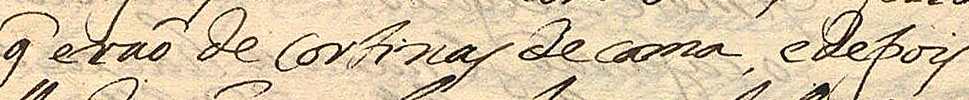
q̄ eraõ de cortinas de cama, e depois
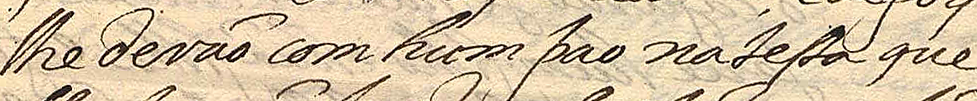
lhe deraõ com hum pao na testa que
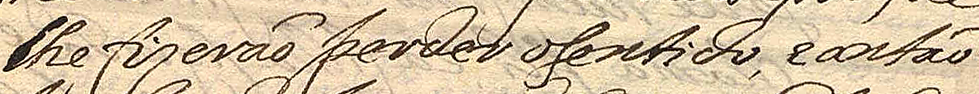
lhe fizeraõ perder o sentido, e antaõ
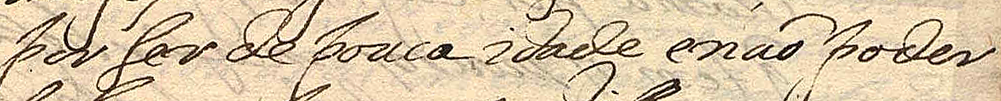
por ser de pouca idade e naõ poder
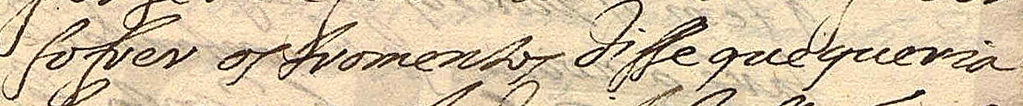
sofrer os tromentos disse que queria
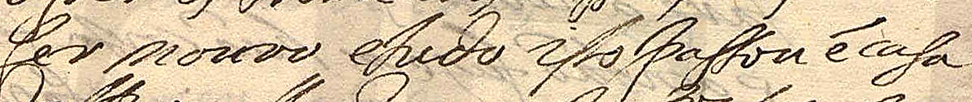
ser mouro e tudo isto passou ē casa
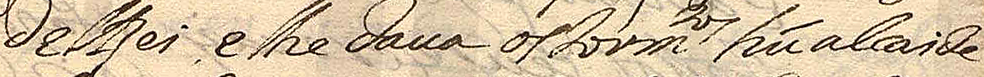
del Rei e lhe daua os tormtos hū alcaide
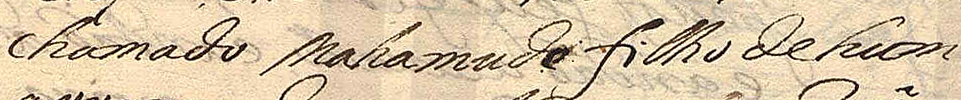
chamado Mahamude filho de hum
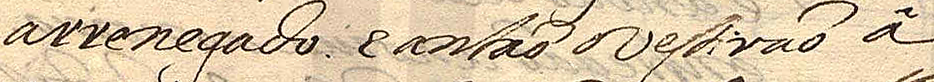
arrenegado. E antaõ o vestiraõ â
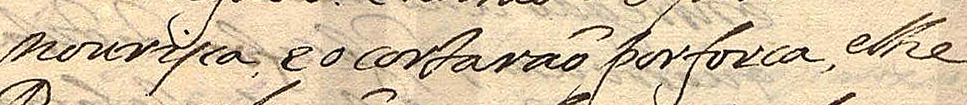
mourisca, e o cortaraõ por força, e lhe
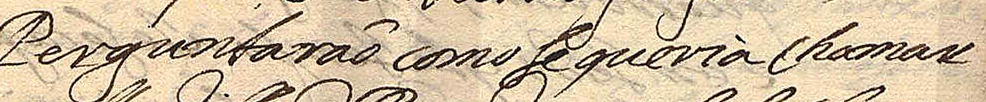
Perguntarão como se queria chamar
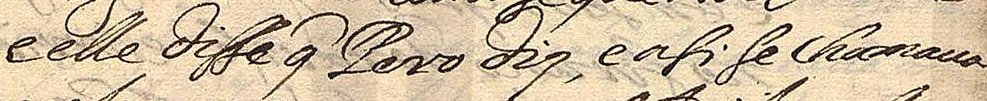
e elle disse q̄ Pero diz, e asi se chamaua
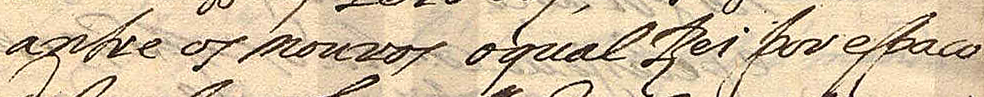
antre os mouros o qual Rei por espaço
